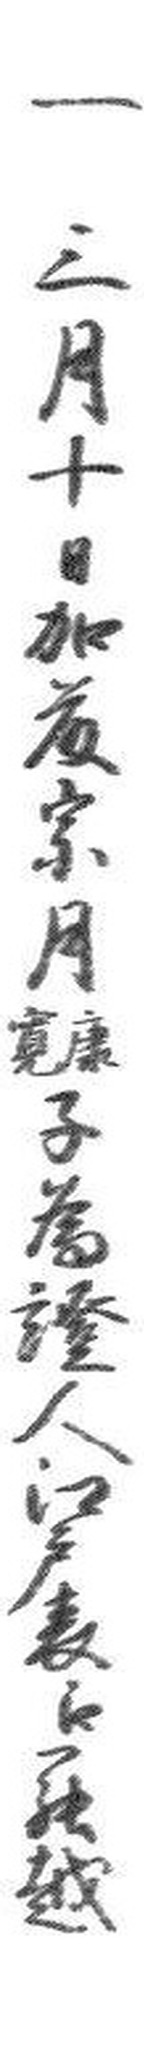一三月十日加藤宗月康寛子為証人江戸表江罷越
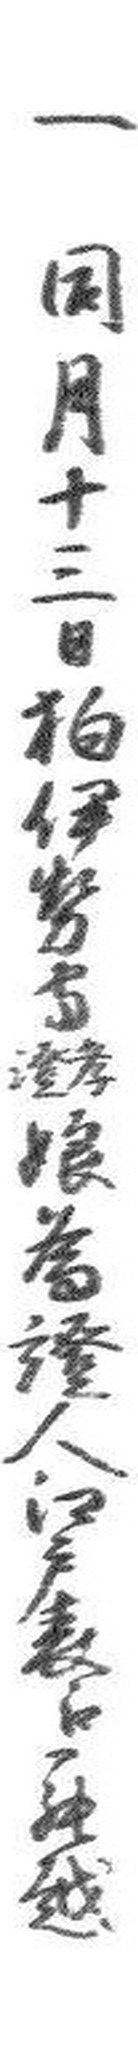一同月十三日狛伊勢守孝澄娘為証人江戸表江罷越
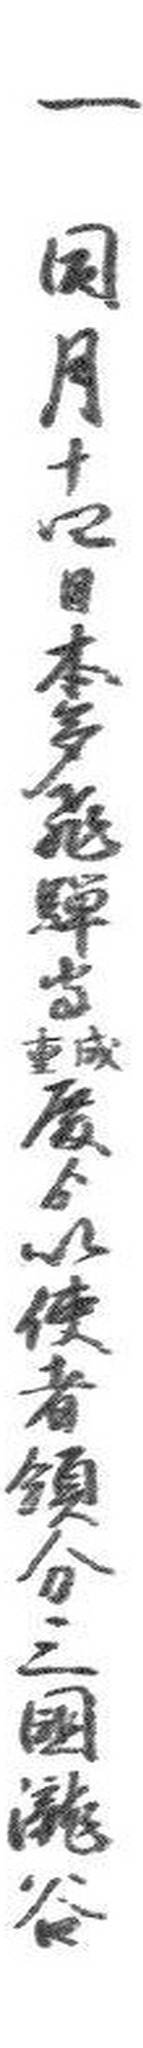一同月十四日本多飛騨守成重殿ゟ以使者領分三国滝谷
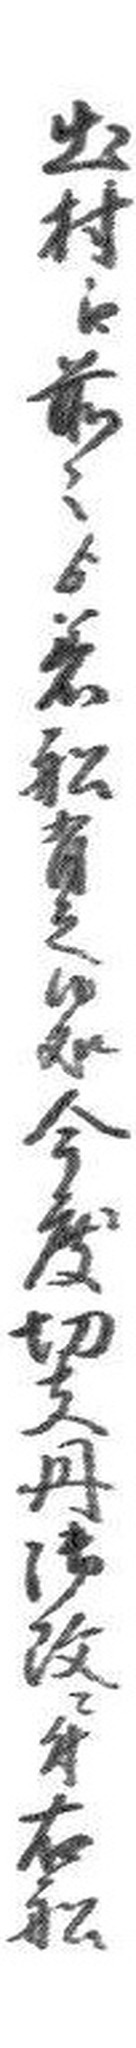出村江前々ゟ着船有之候処今度切支丹御改ニ付右船
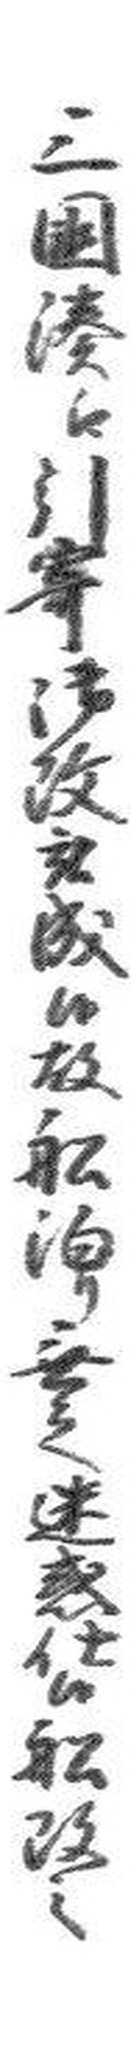三国湊江引寄御改被成候故船泊リ無之迷惑仕候船改之
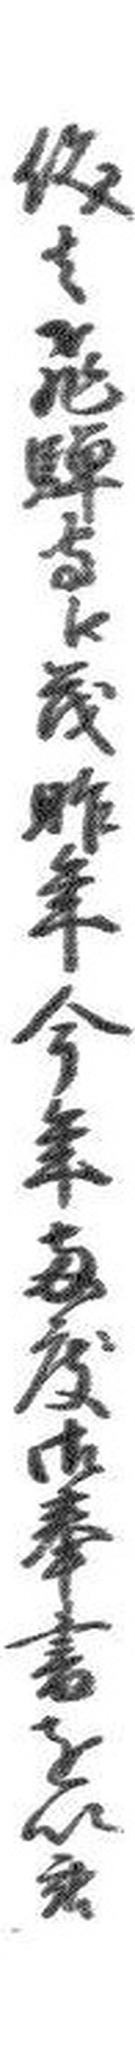儀者飛騨守江茂昨年今年両度御奉書を以被
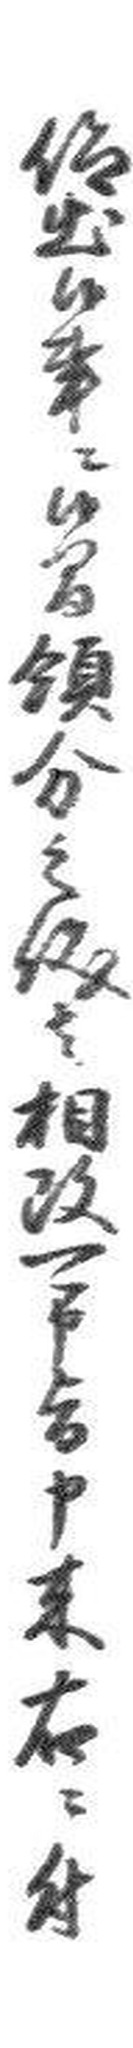仰出候事ニ候間領分之儀者相改可申旨申来右ニ付

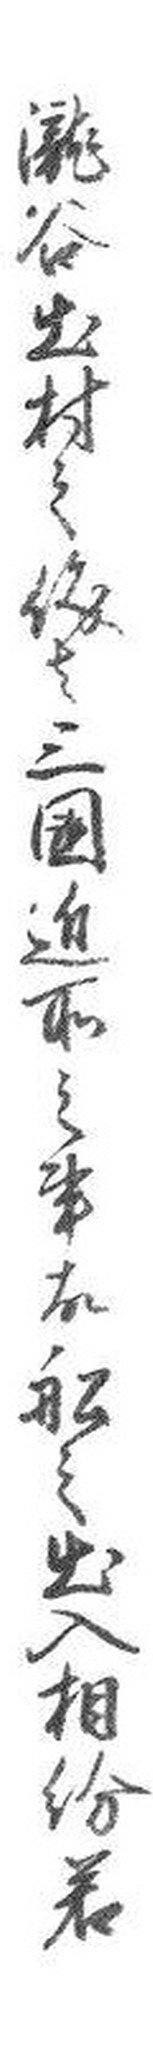滝谷出村之儀者三国近所之事故船之出入相紛若
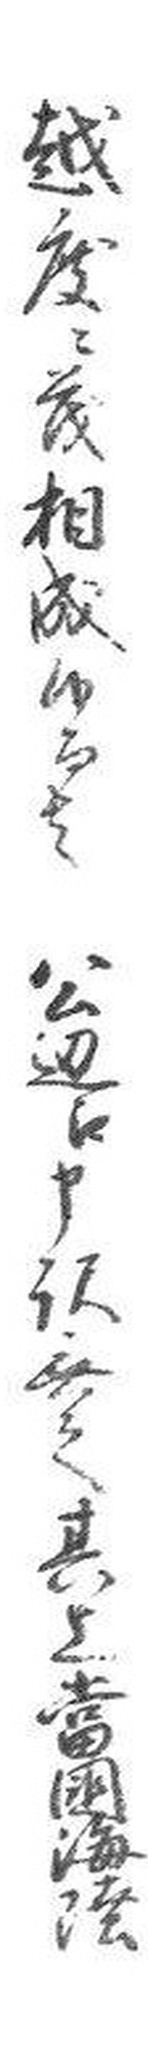越度ニ茂相成候而者公辺江申訳無之其上当国海陸
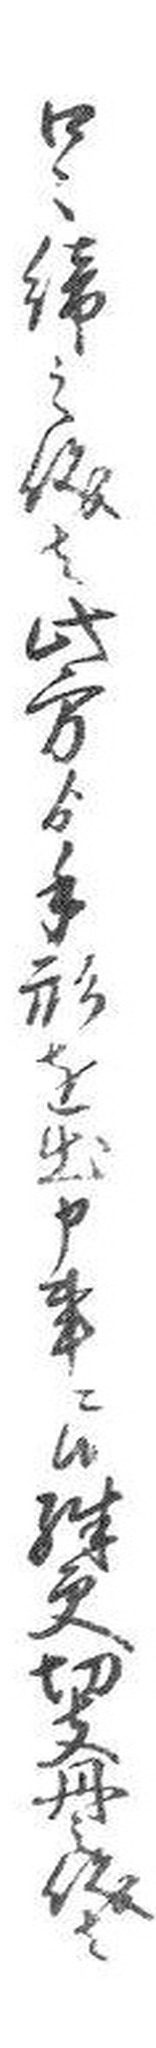口々締之儀者此方ゟ手形を出申事ニ候殊更切支丹之儀者
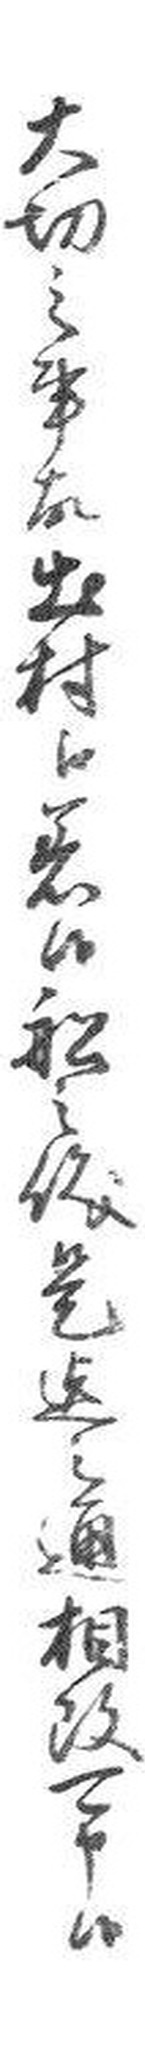大切之事故出村江着候船之儀是迄之通相改可申候
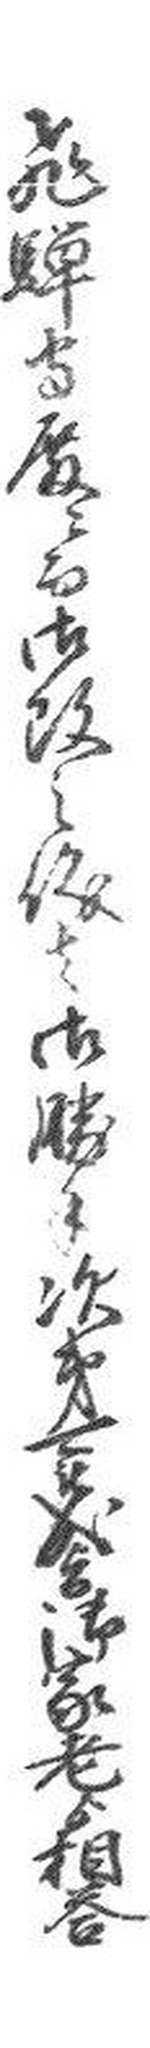飛騨守殿ニ而御改之儀者御勝手次第可被成旨御家老ゟ相答
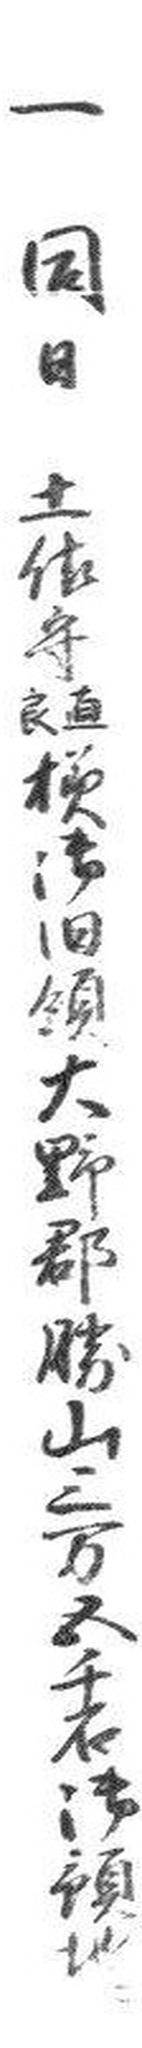一同日土佐守直良様御旧領大野郡勝山三万五千石御領地ニ
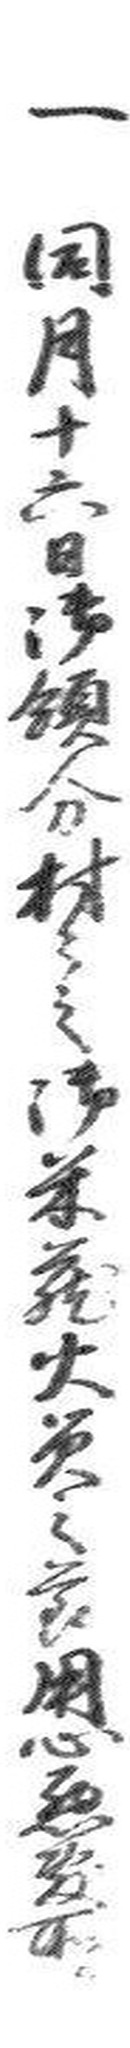一同月十六日御領分村々之御米蔵火災之節用心悪敷所
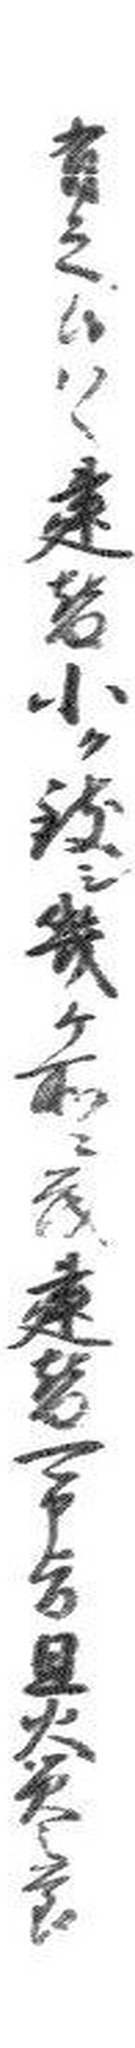有之候ハヽ建替小ク致シ幾ヶ所ニ茂建替可申旨且火災之節
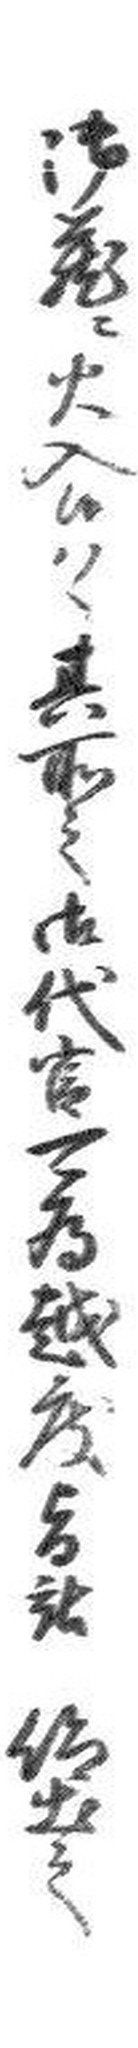御蔵ニ火入候ハヽ其所之御代官可為越度旨被仰出之
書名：家譜 四 忠昌公 従寛永七年到正保四年
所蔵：福井県文書館 Fukui Prefectural Archives
